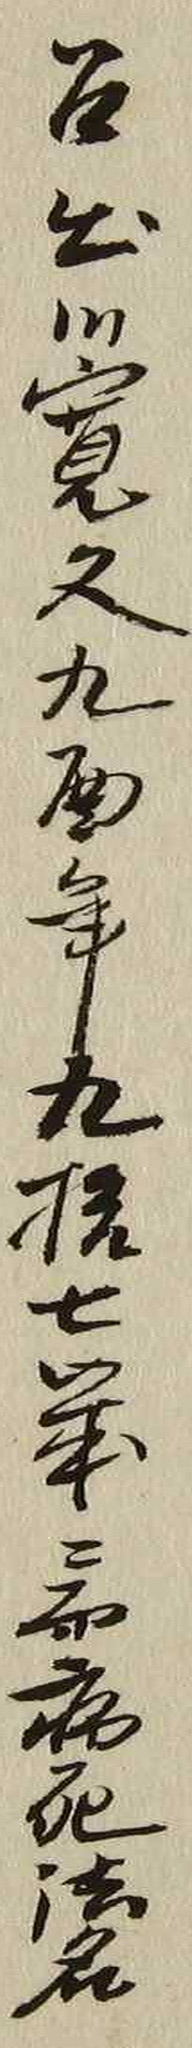召出候寛文九酉年九拾七歳ニ而病死法名
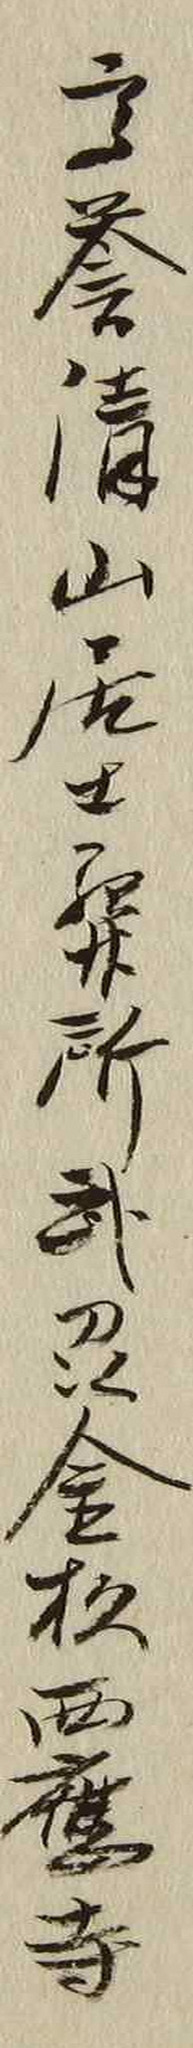高誉清山居士葬所武州金杉西応寺
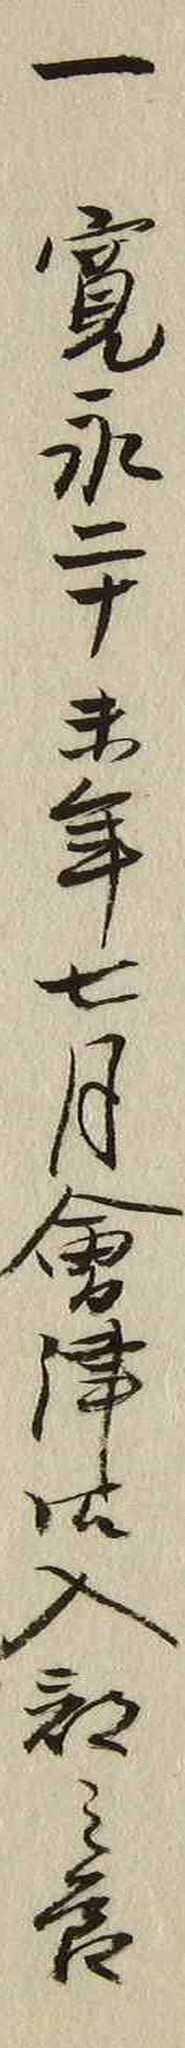一寛永二十未年七月会津御入部之節
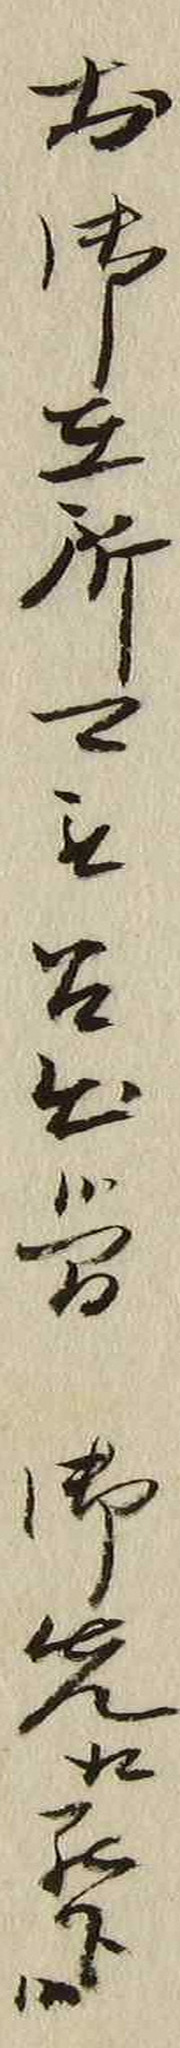於御在所可被召出候間御先江罷下候
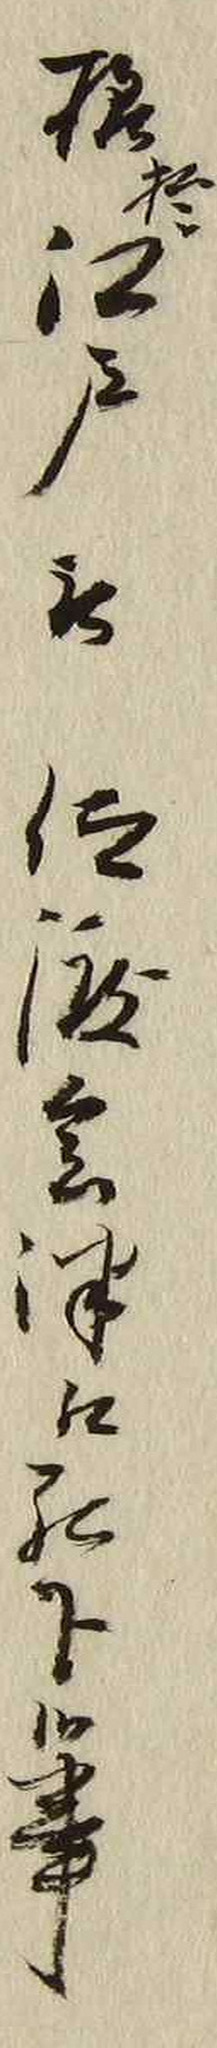様於江戸被仰渡会津江罷下候事
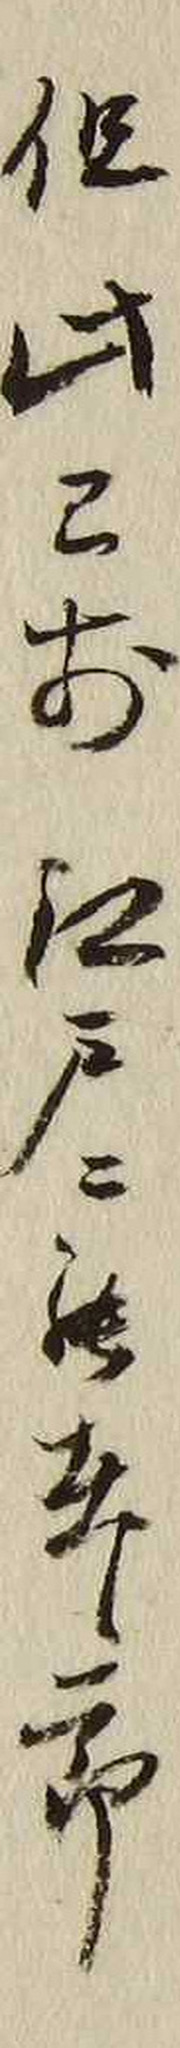但此已前江戸ニ罷在候節
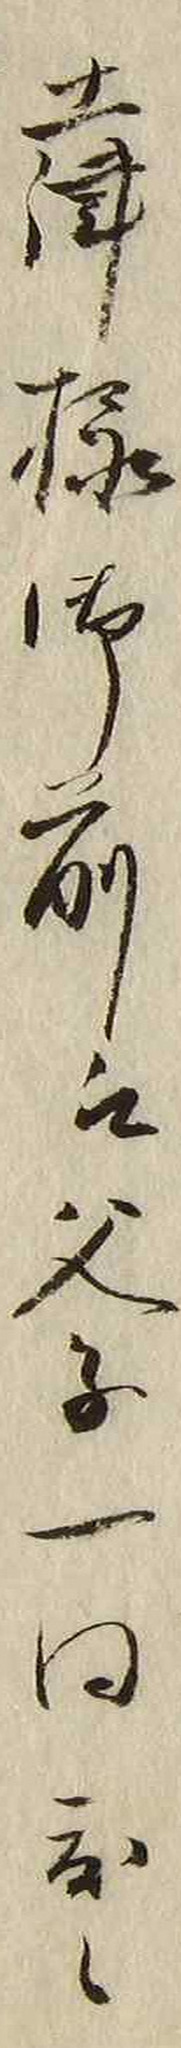土津様御前江父子一同度々

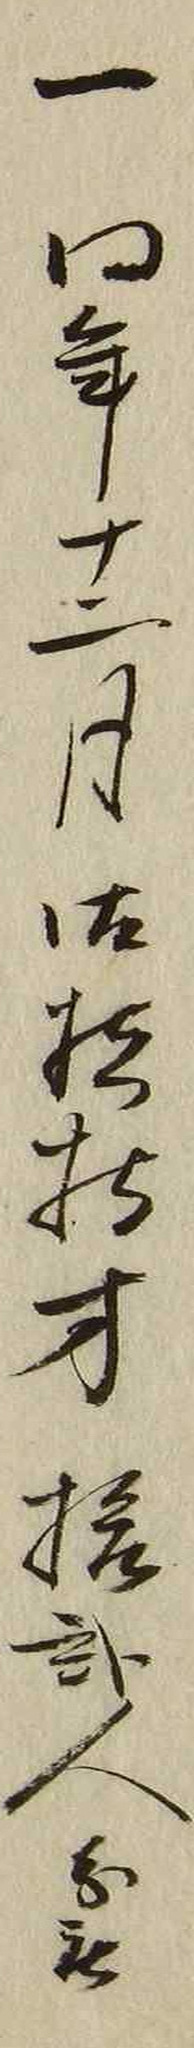一同年十二月御扶持方拾弐人分被
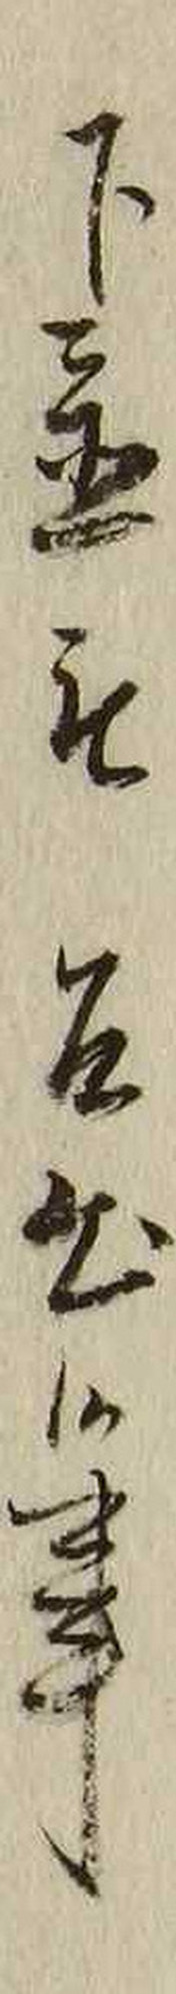下置被召出候事
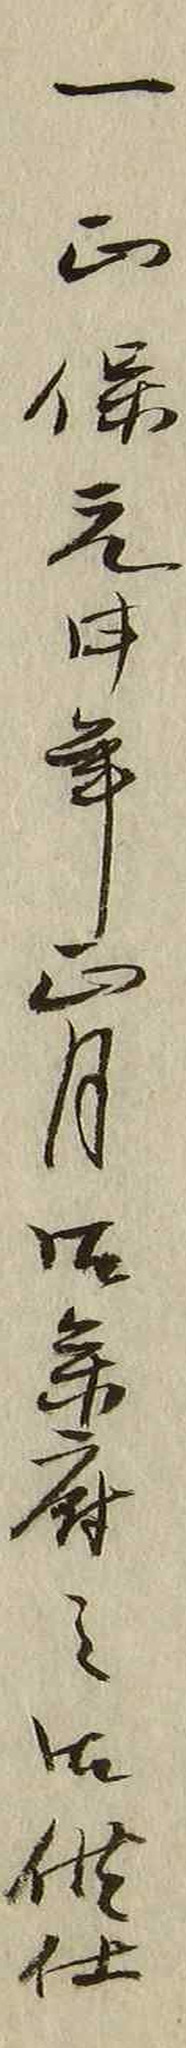一正保元申年正月御参府之御供仕
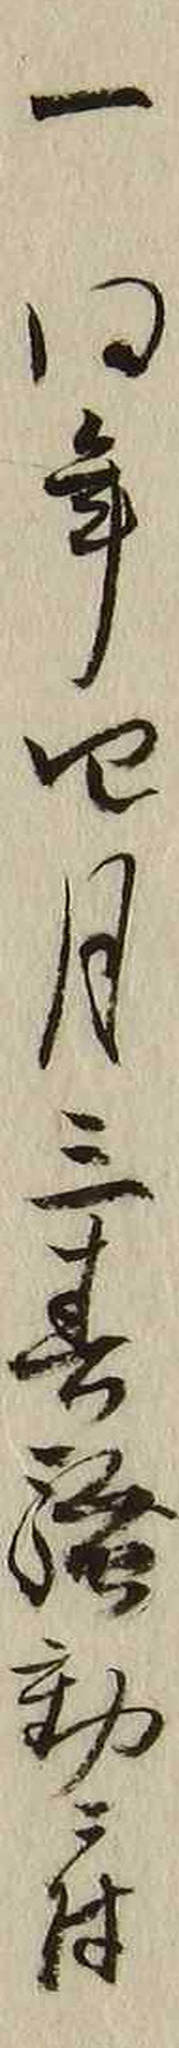一同年四月三春騒動ニ付
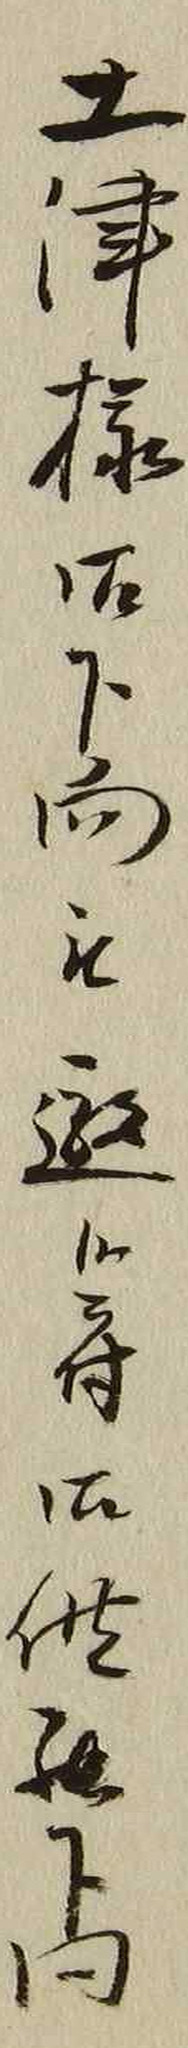土津様御下向被遊候ニ付御供罷下同
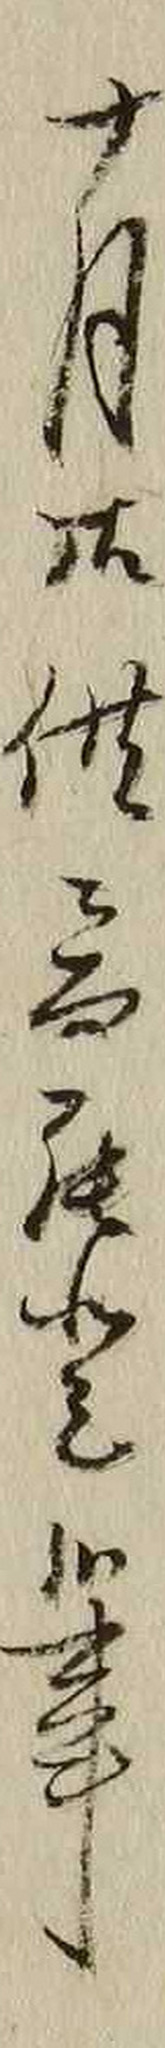十月御供ニ而罷登候事
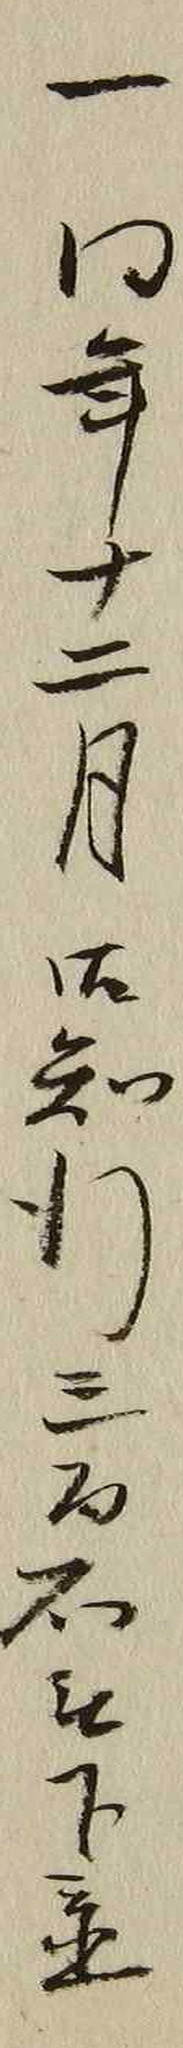一同年十二月御知行三百石被下置
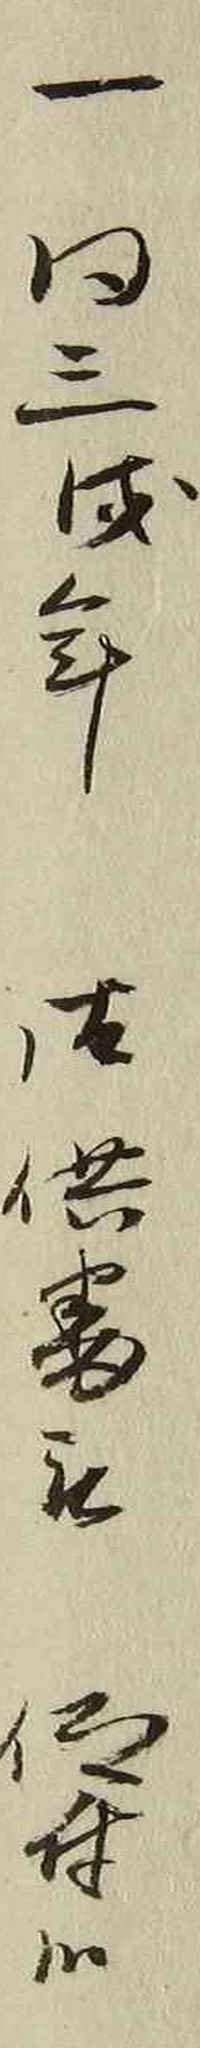一同三戌年御供番被仰付候
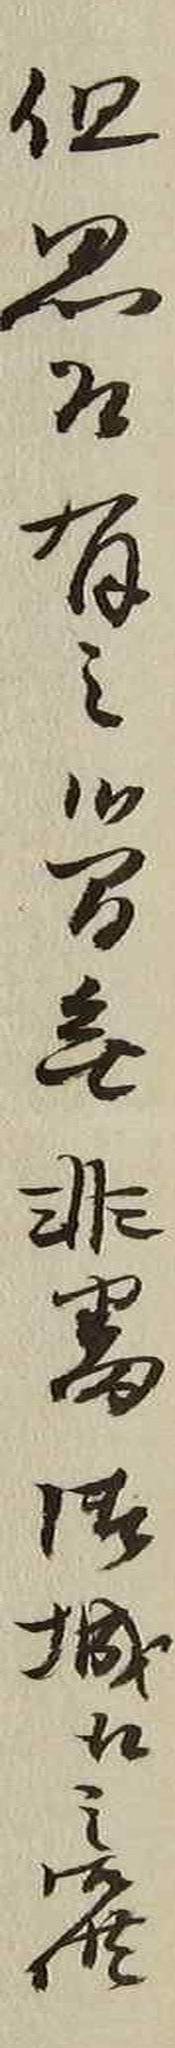但思召有之候間無非番御城江之御供
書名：諸士系譜　巻之345　も之部1
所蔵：会津若松市立会津図書館
